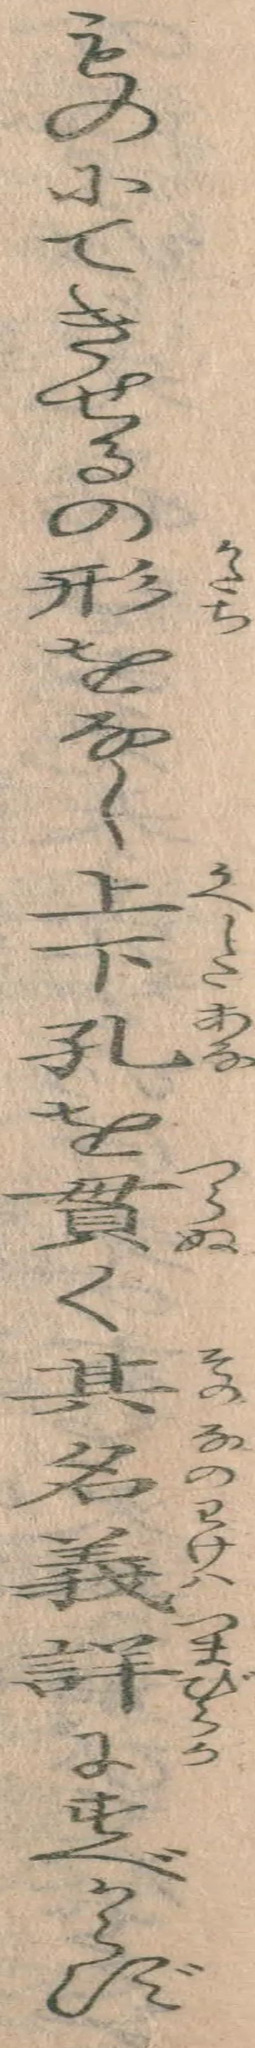ものにてきせるの形をなし上下孔を貫く其名義詳にすべからず
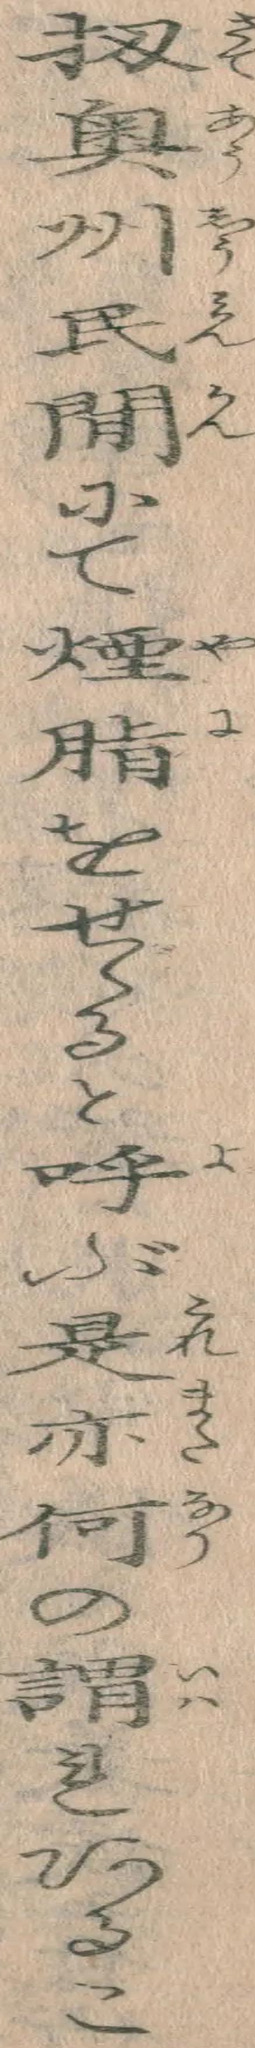扨奥州民間にて煙脂をせゝると呼ぶ是亦何の謂れあるこ
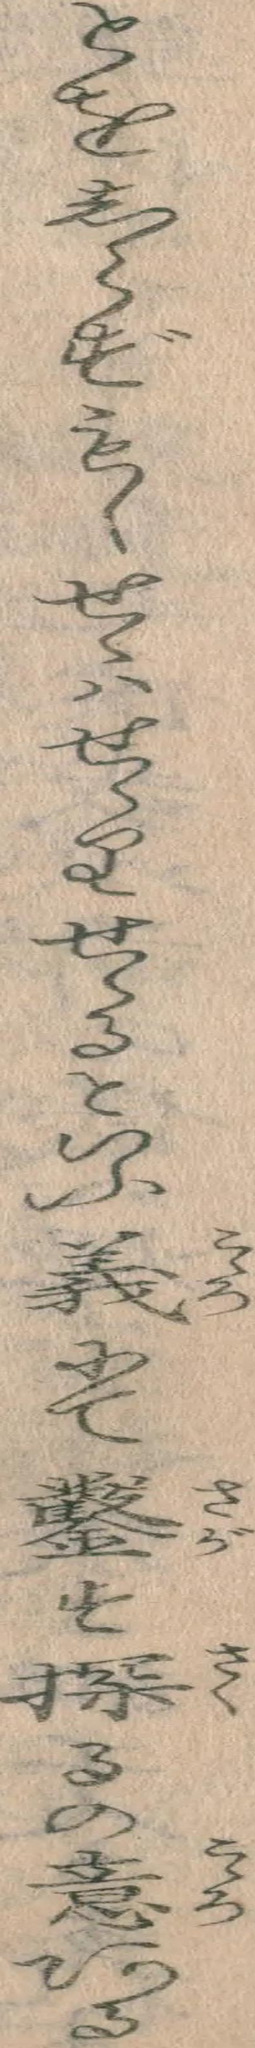とをしらばもしせゝはせゝりせゝるといふ義にて鑿は探るの意ある
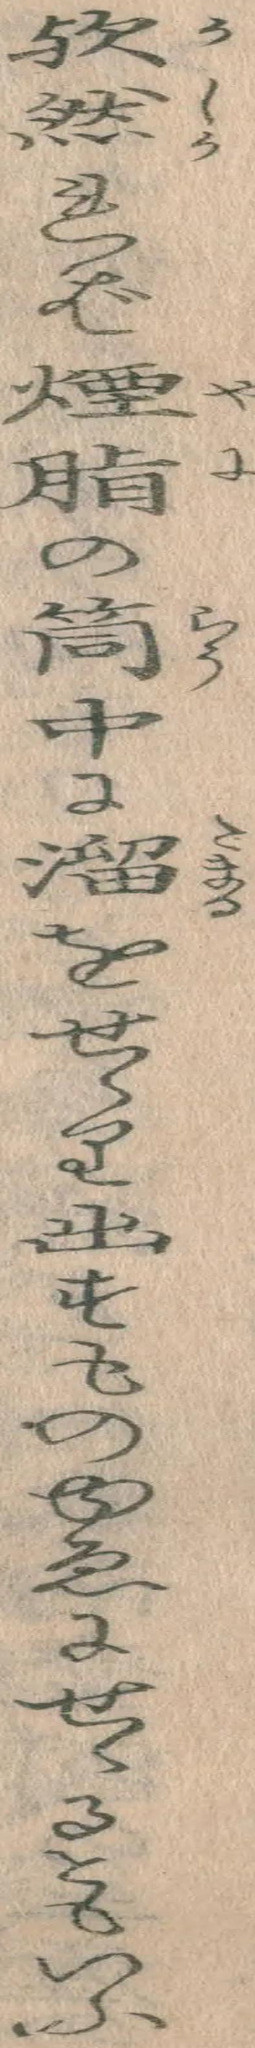歟然れば煙脂の筒中に溜をせゝり出すものゆゑにせゝるともいふ
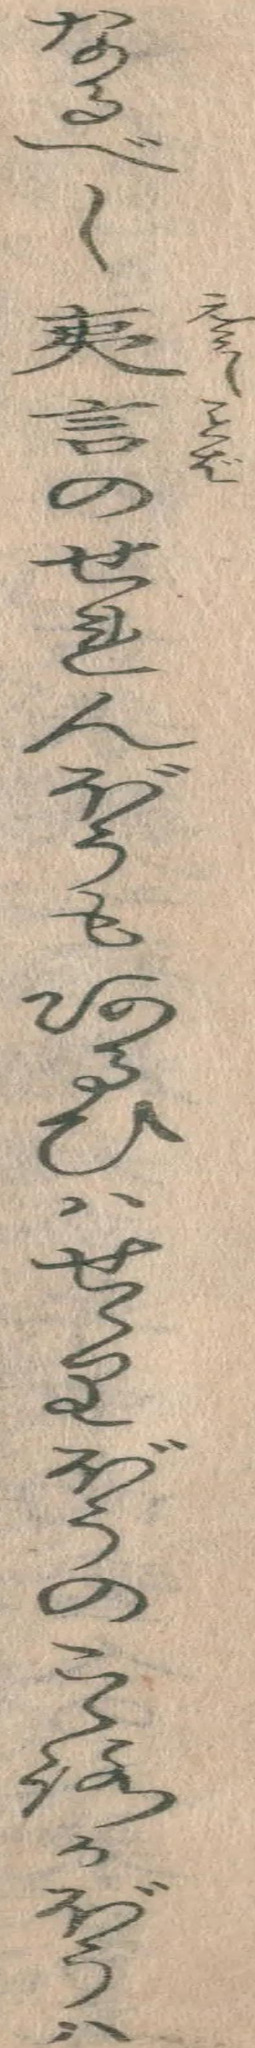なるべし夷言のせれんぼうもあるひはせゝりぼうのこゝろかぼうは
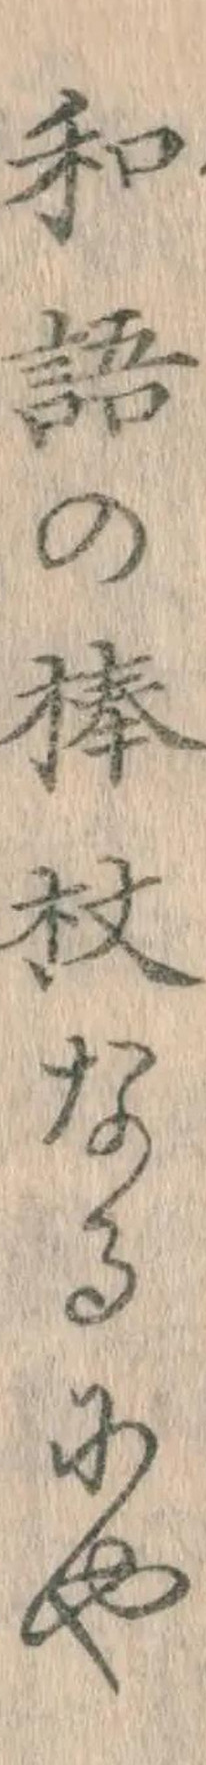和語の棒杖なるにや
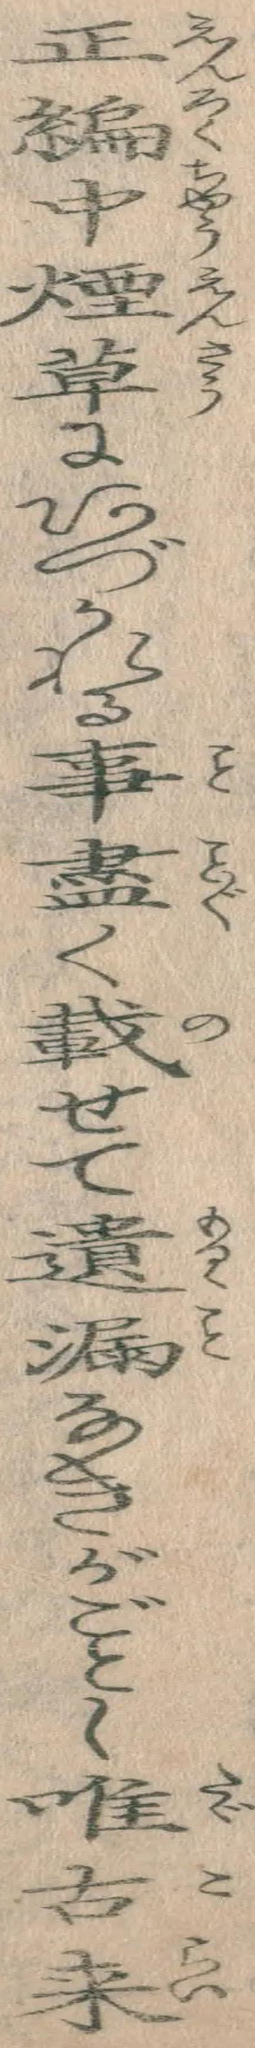正編中煙草にあづかれる事尽々く載せて遺漏なきがごとし唯古来
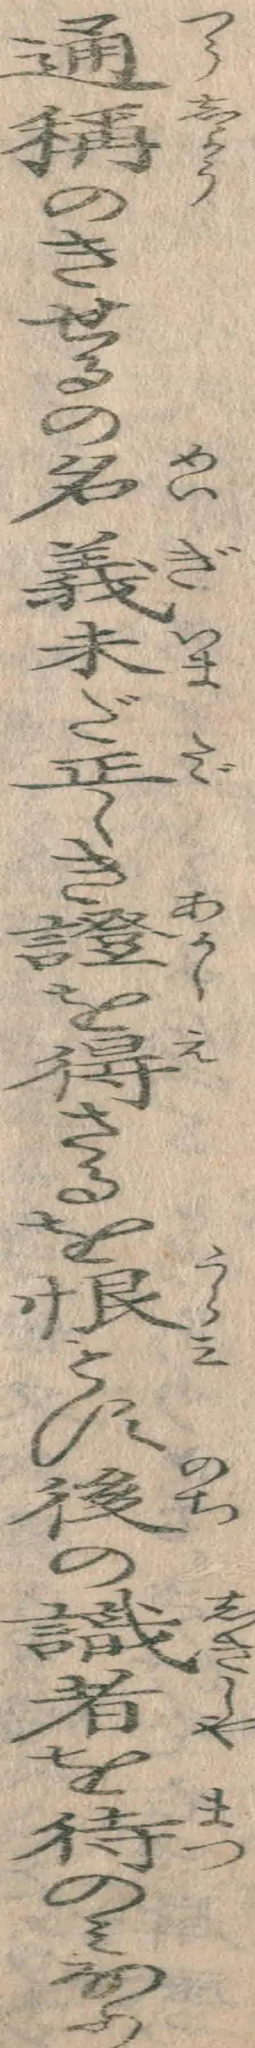通称のきせるの名義未だ正しき証を得さるを恨とす後の識者を待のみなり
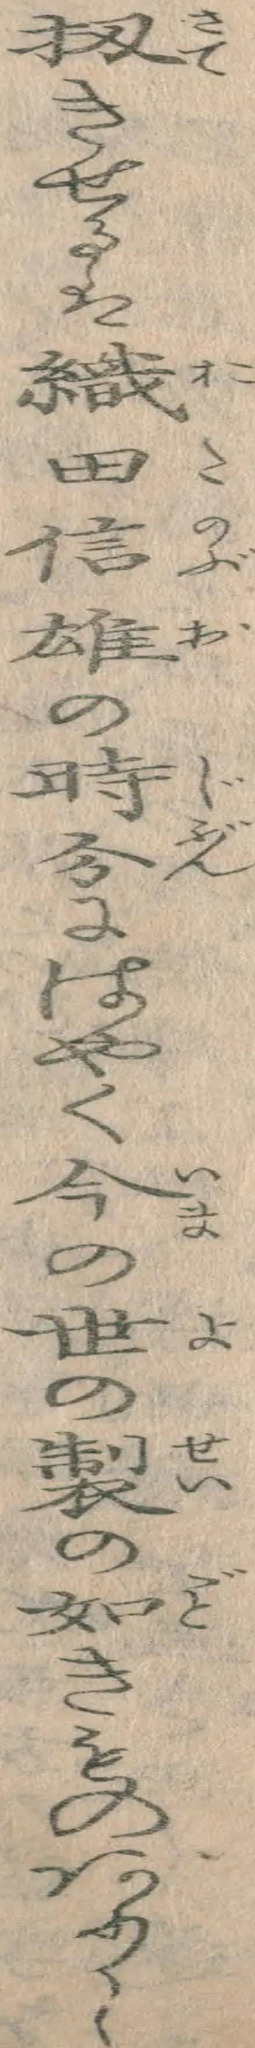扨きせるは織田信雄の時分にはやく今の世の製の如きものありし
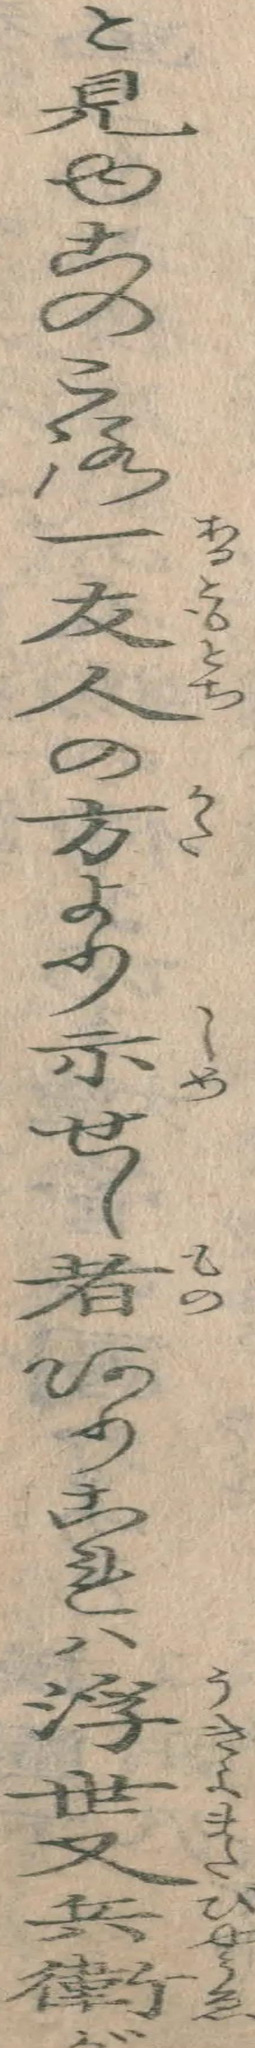と見ゆこのころ一友人の方より示せし者ありこれはう浮世又兵衛が

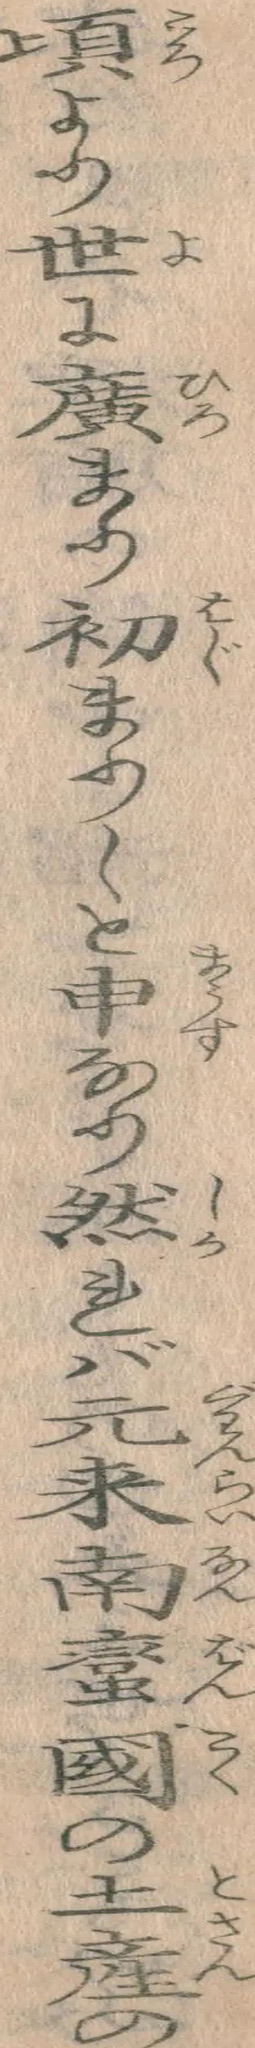頃より世に広まり初まりしと申なり然れば元来南蛮国の土産の
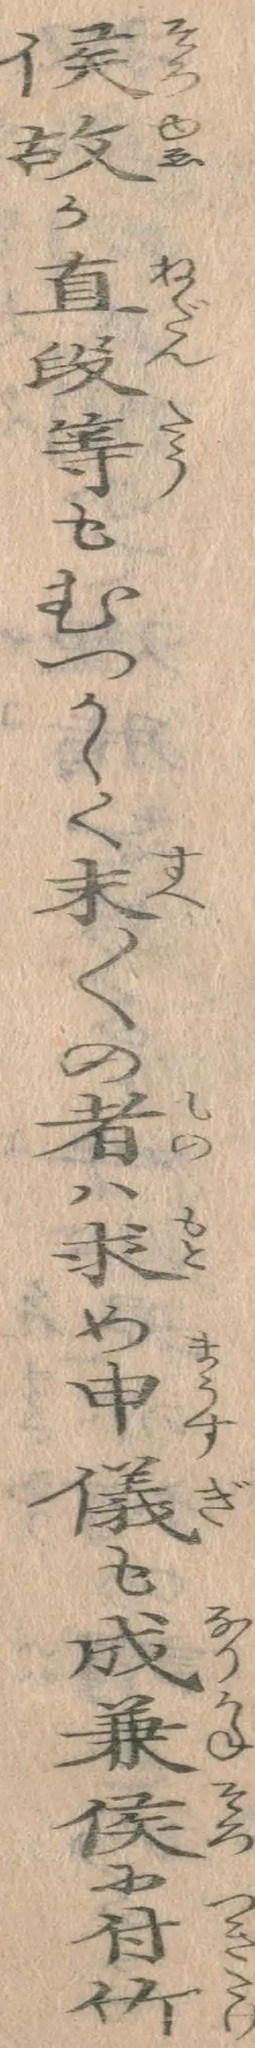侯故か直段等もむつかしく末〳〵の者は求め申儀も成兼侯に付竹
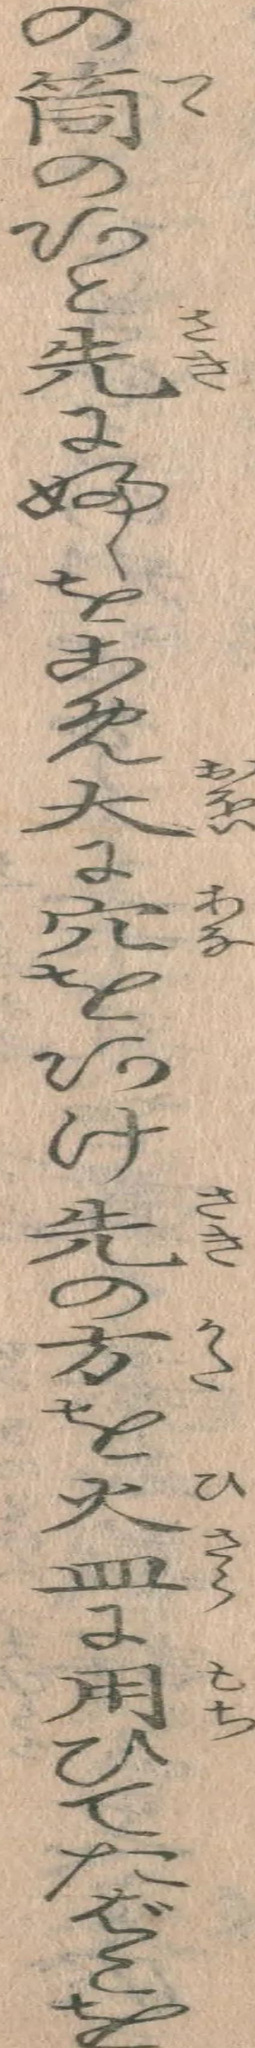の筒のあと先にふしをこめ大に穴をあけ先の方を火皿に用ひてたばこを
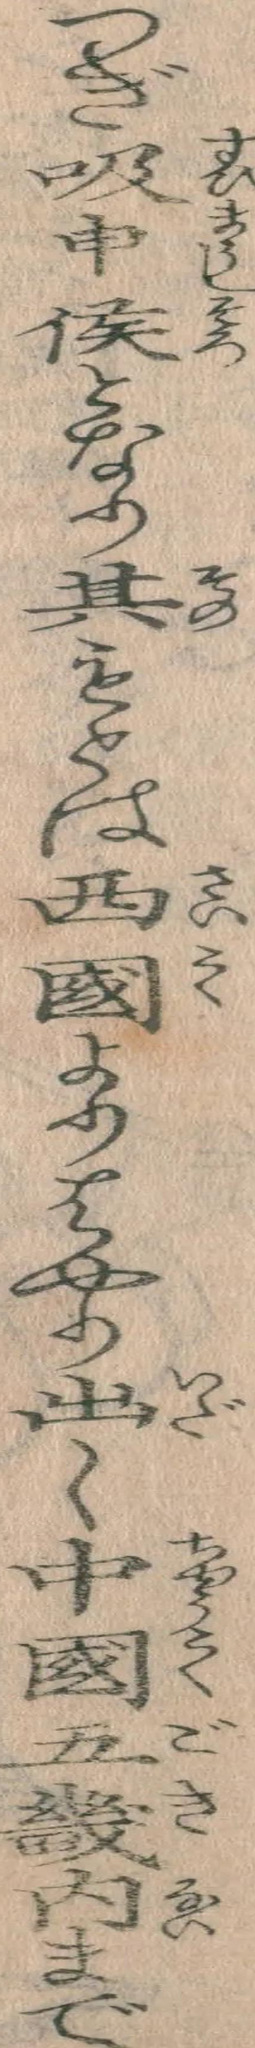つぎ吸申侯となり其もとは西国よりはやり出し中国五畿内まで
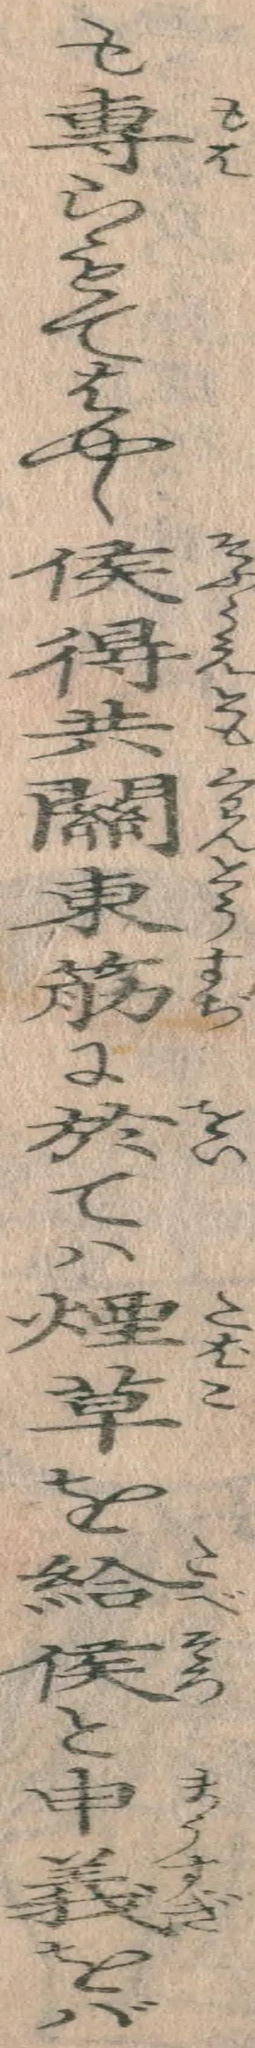も専らもてはやし侯得共関東筋に於ては煙草を給侯と申義をば
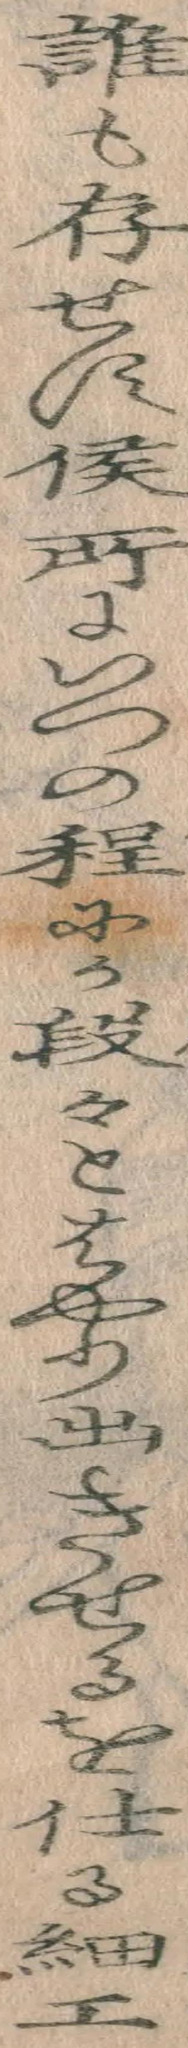誰も存せす侯所にいつの程にか段々とはやり出きせるを仕る細工
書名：目さまし草
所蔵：国立国会図書館 National Diet Library, JAPAN
